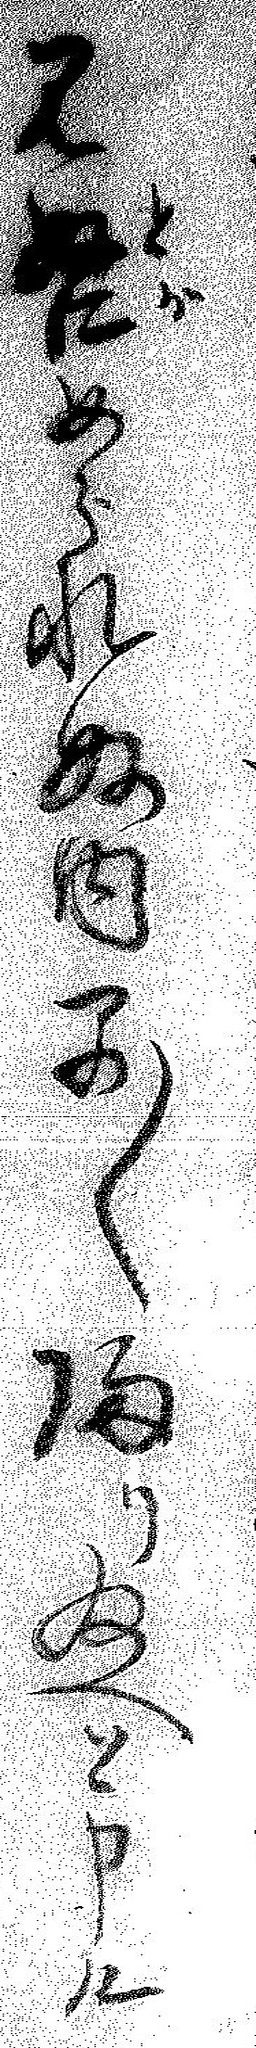見咎められぬ内早〳〵帰り給へと申け

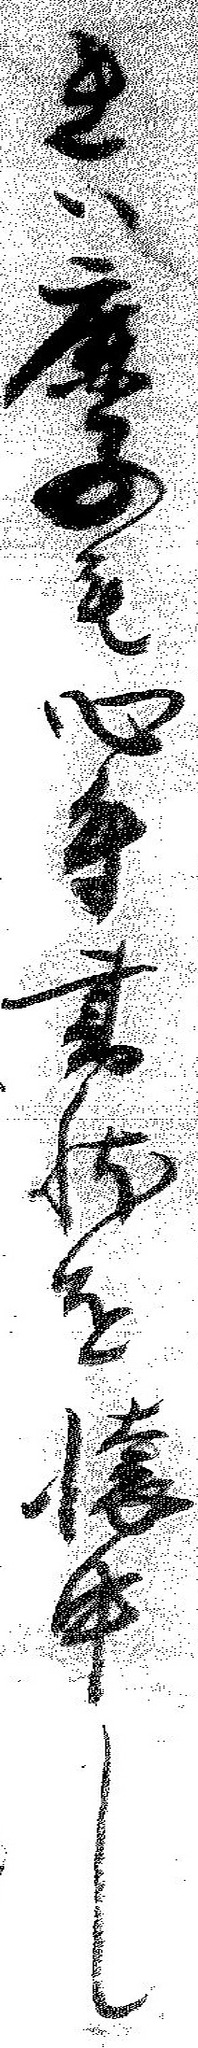れは鹿子も心付書状を懐中し
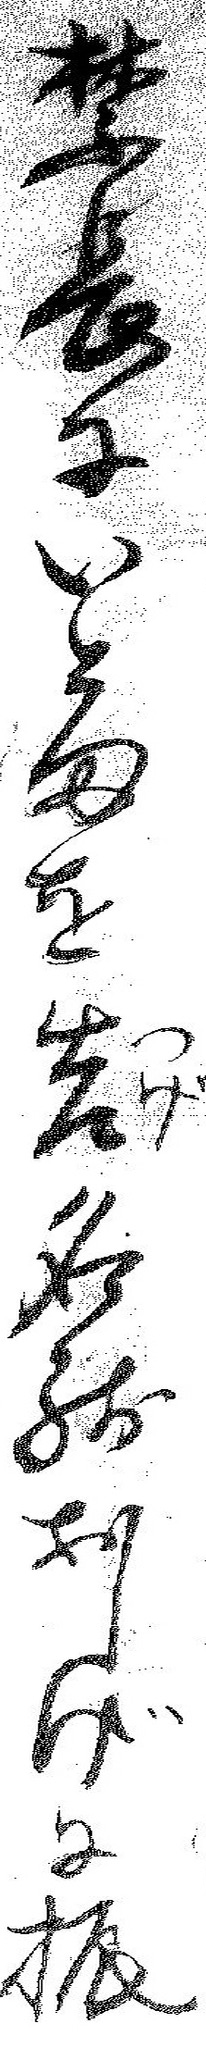禁長にいとまを告名残おしげに振
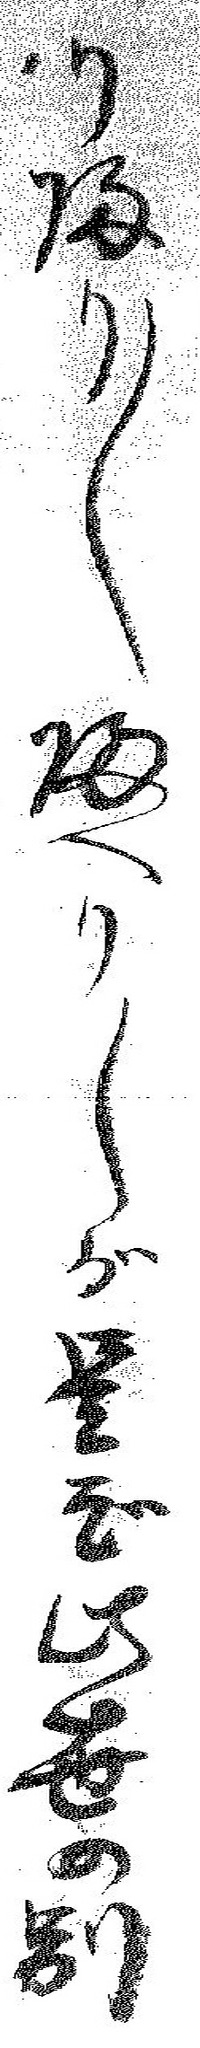り帰り〳〵帰へりしが是ぞ此世の別
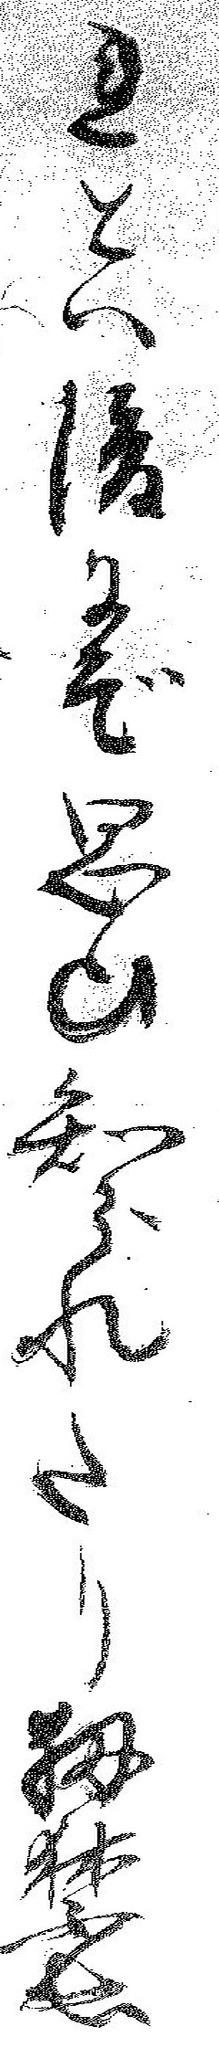れとは後にぞ思ひ知られたり扨禁長
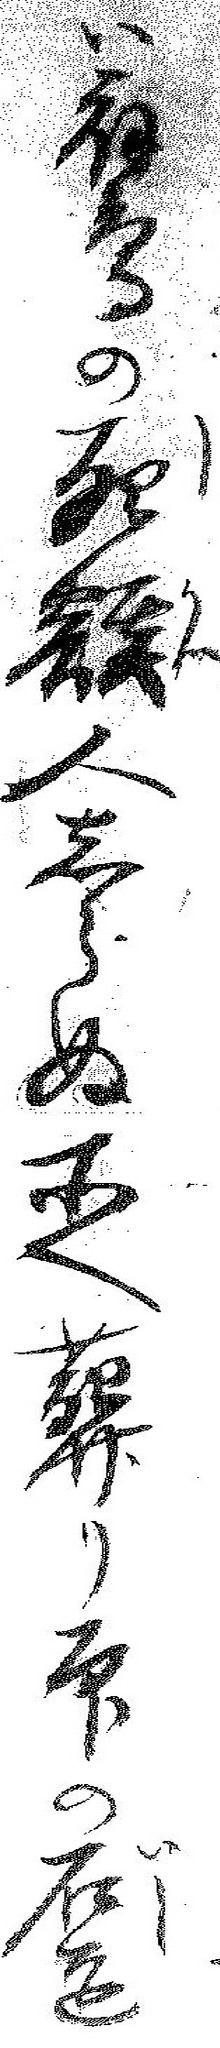は鷹の死骸人しらぬ所へ葬り印の石を
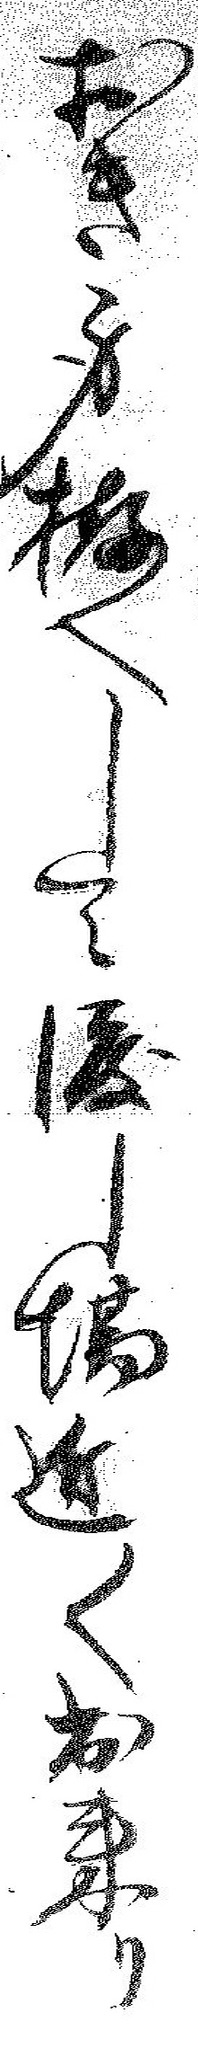おき身拵へして渡し場近く出来り
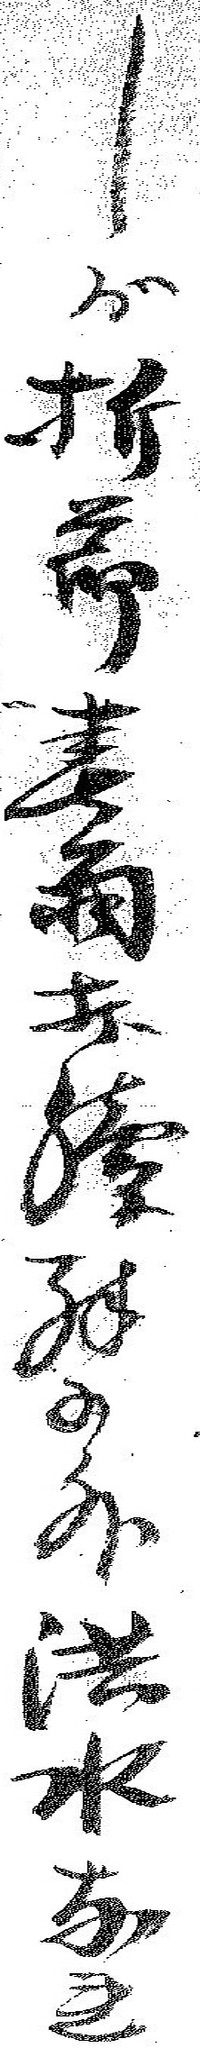しが折節長雨打続殊の外洪水なれ
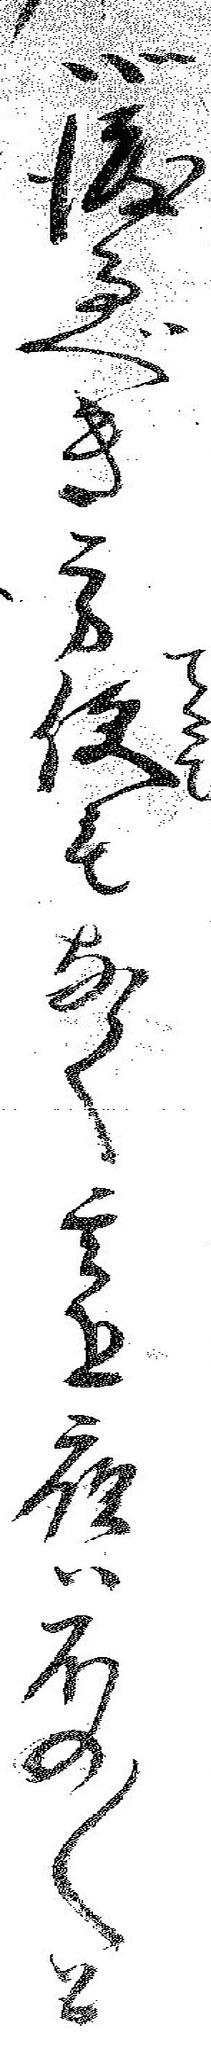ば渡るべき方便もなく其上夜はほの〳〵と
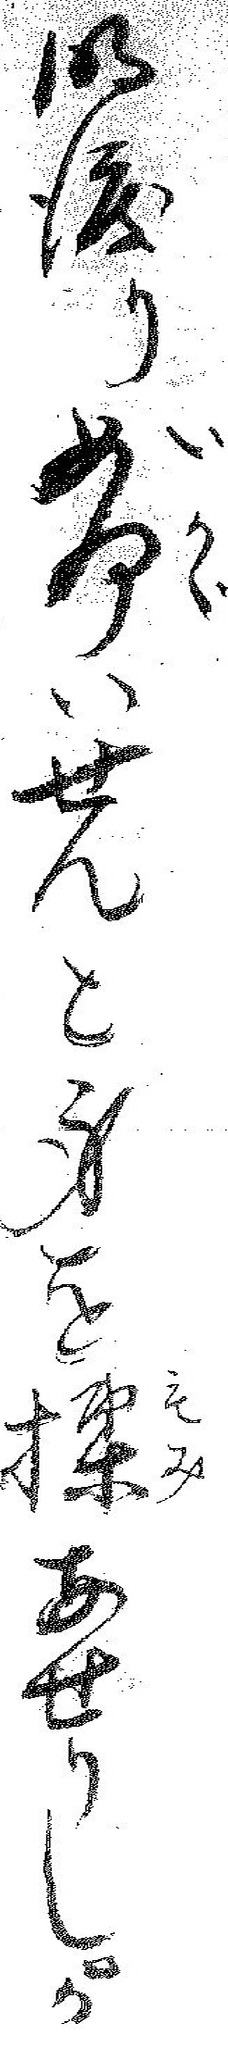明渡り如何いせんと身を揉あせりしが
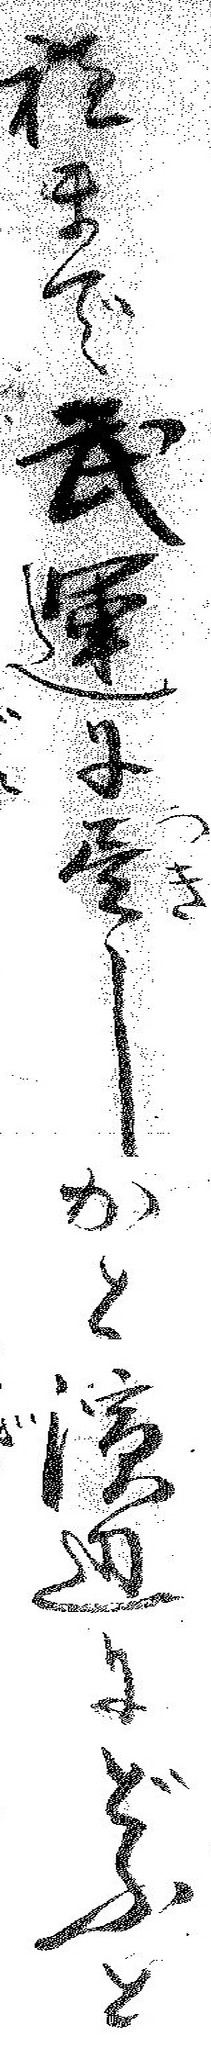程まで武運に尽しかと浜辺にどふと
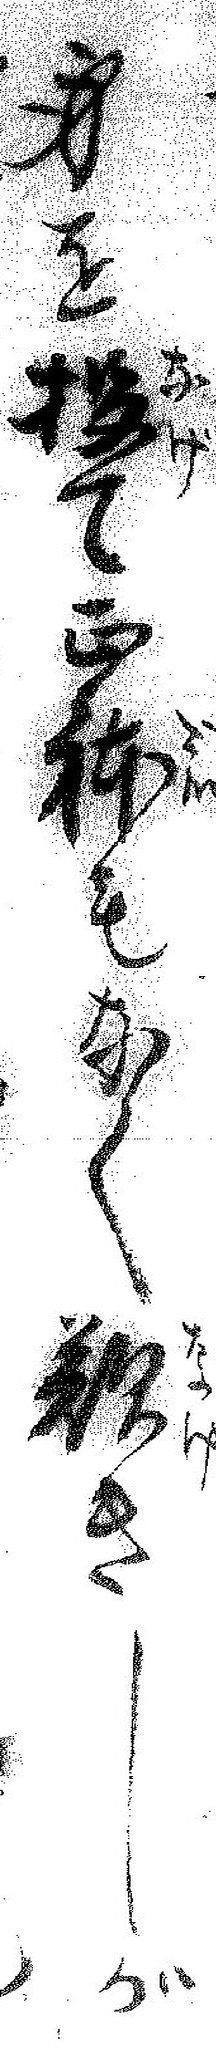みを投て正体もなく歎きしが
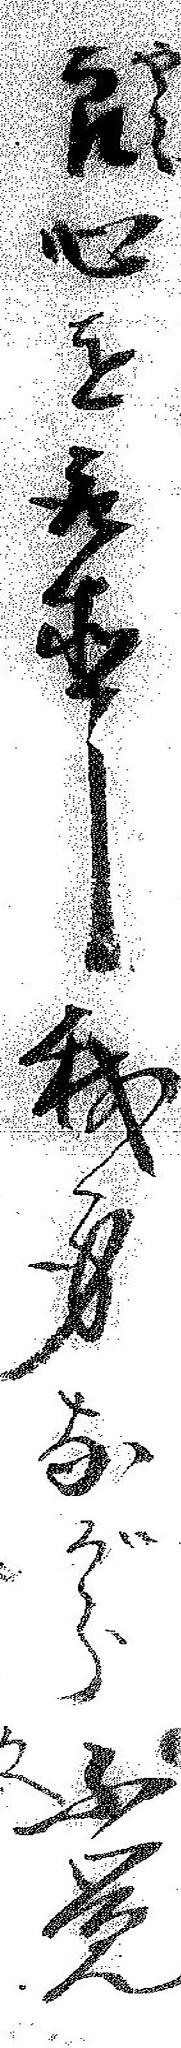良心を取直し我身ながら不覚
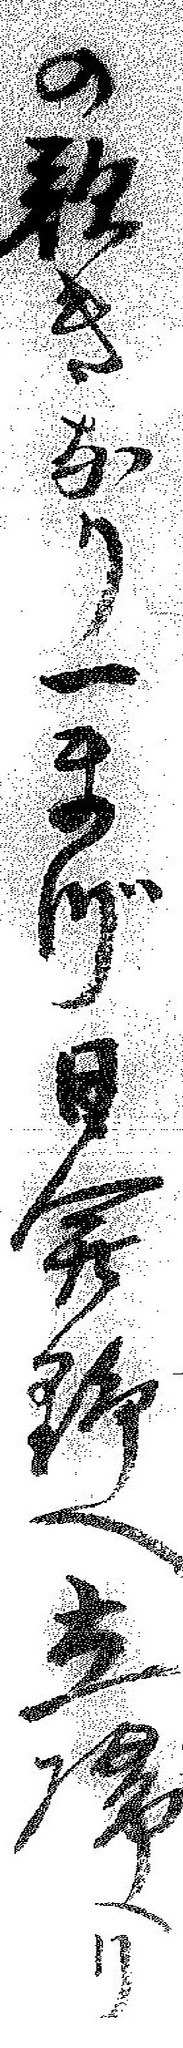の歎なり一まづ日開野へ立帰へり
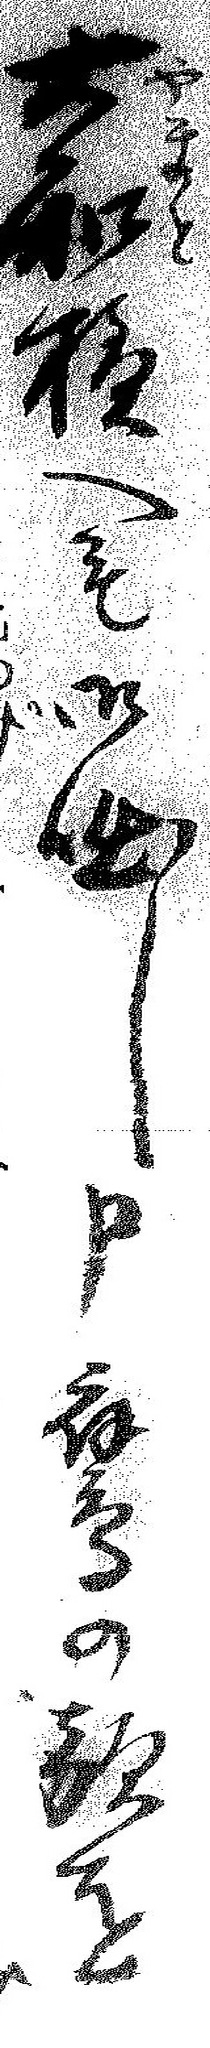大和様へも御咄し申鷹の敵を
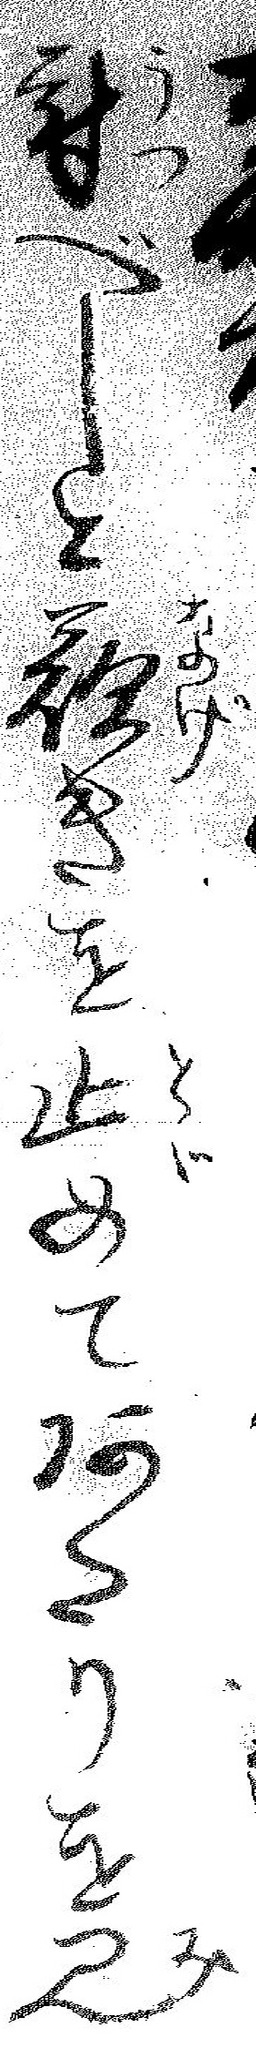討べしと歎きを止めてあたりを見
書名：近頃古狸珍説　礼義智信
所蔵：徳島県立図書館
